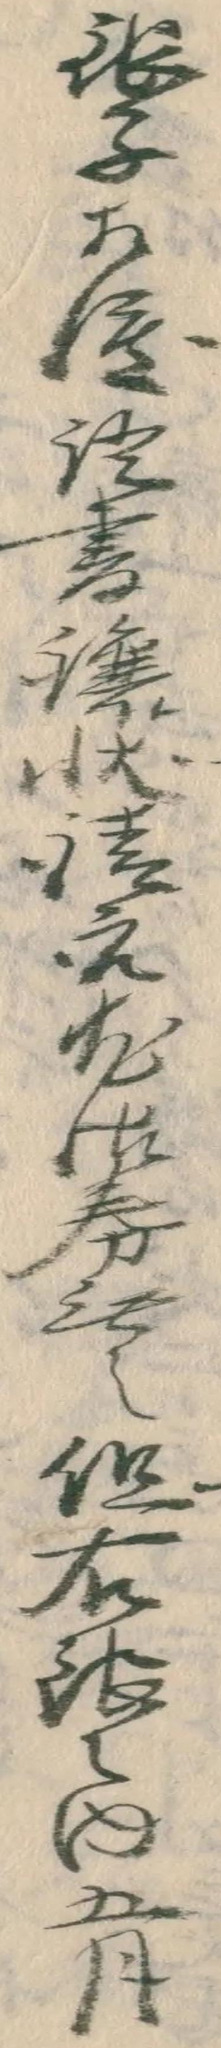銀子相渡證書譲状請取尤沽券無之但右銀之内五月
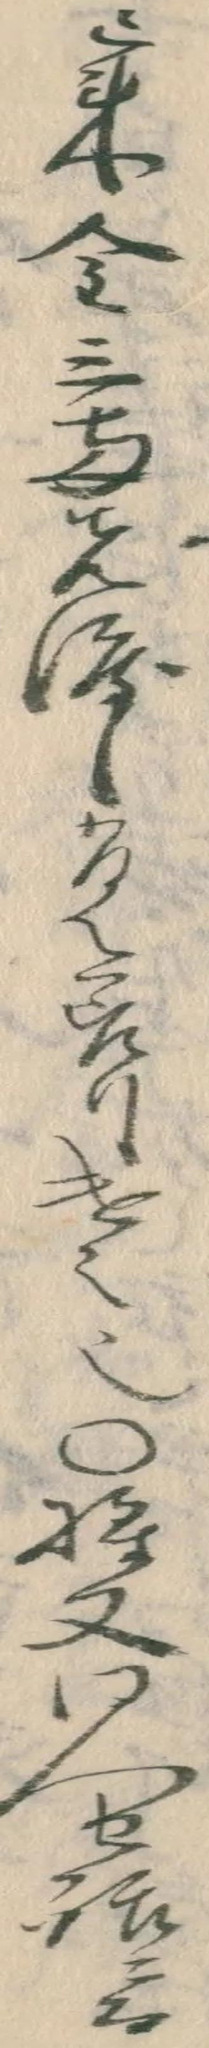已来金三両先渡し有之差引遣之也○将又同人世話ニ而
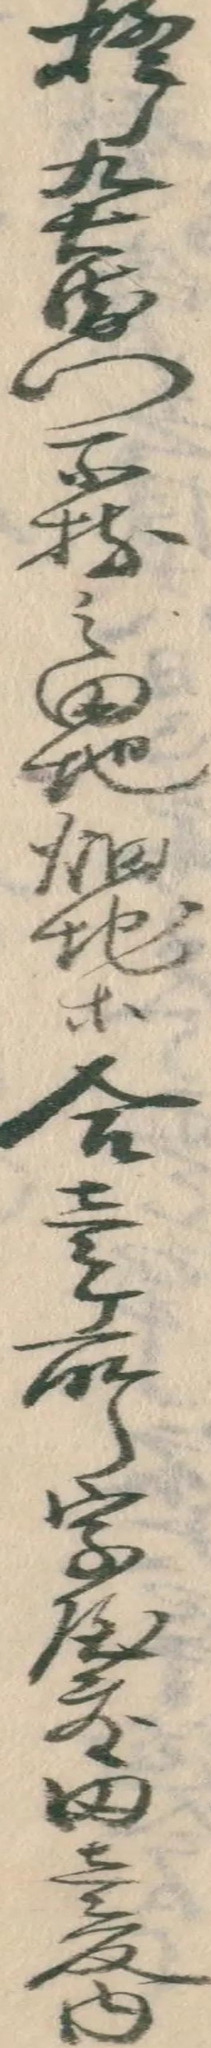柊九右衛門所持之田地畑地等合壱ヶ所字屋敷田壱反内
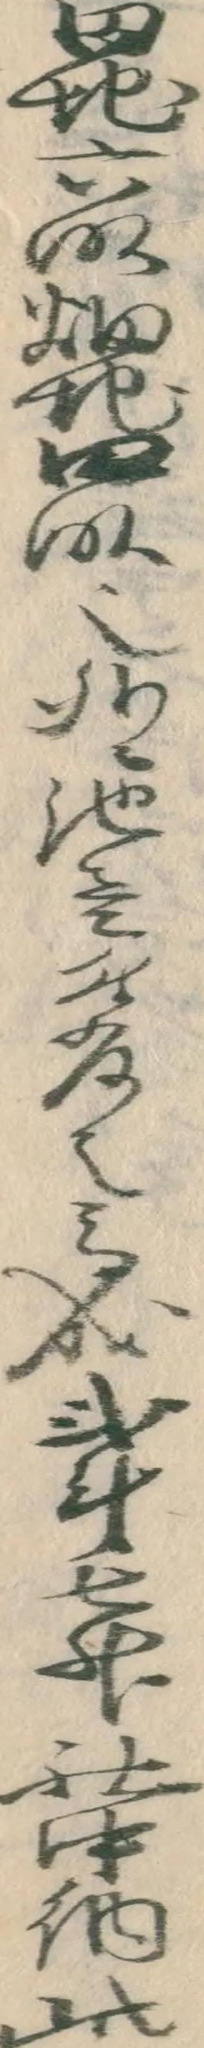田地六畝畑地田畝之外に池壱升有之高成弐斗七升社中納此
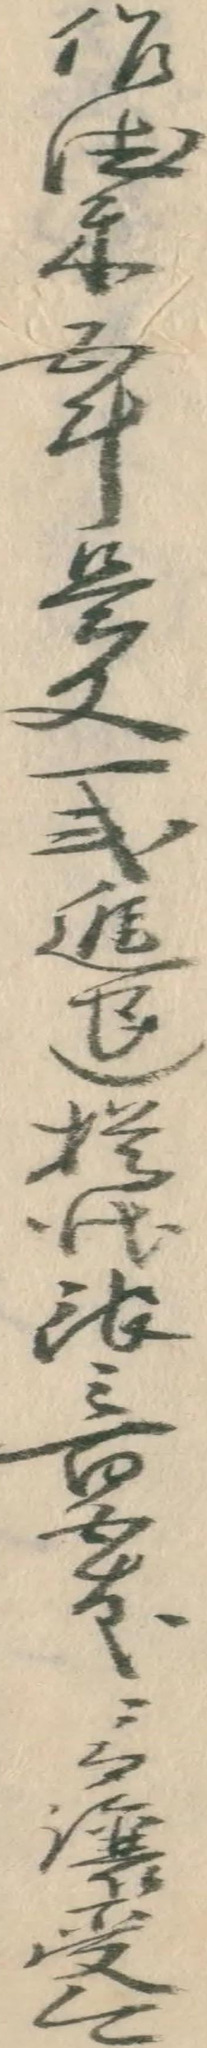作徳米五斗是又一式進退樽代銀三百五十匁ニ而譲受今
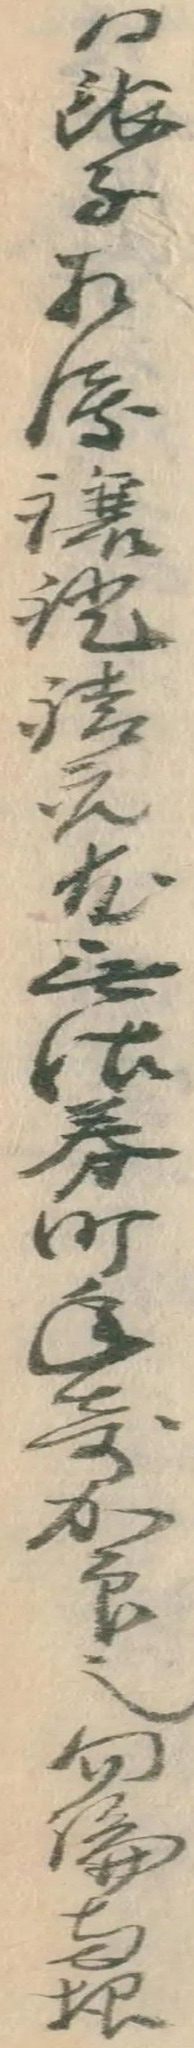日銀子相渡譲證請取尤無沽券町年寄加印也勿論両銀

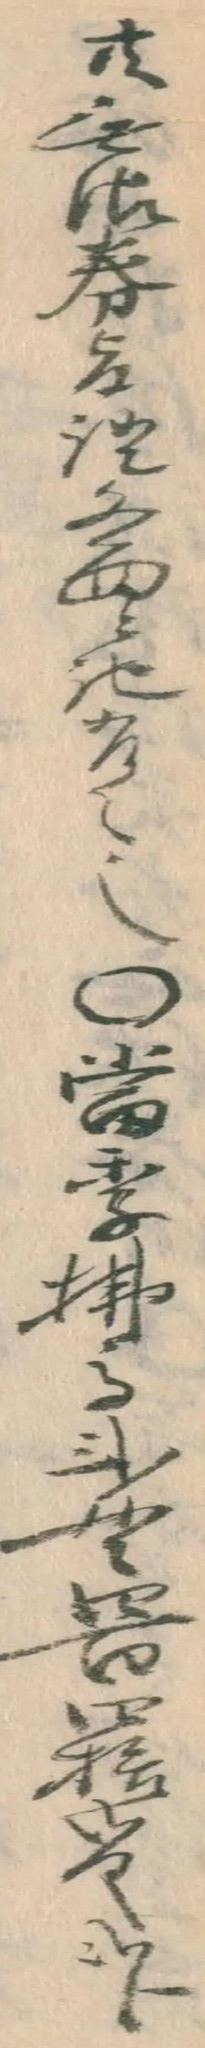共無沽券旨證文面ニ記有之也〇當季払高弐貫四百四拾弐匁弐分
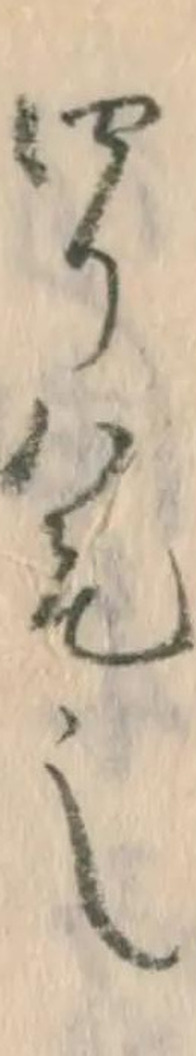四り八毛也
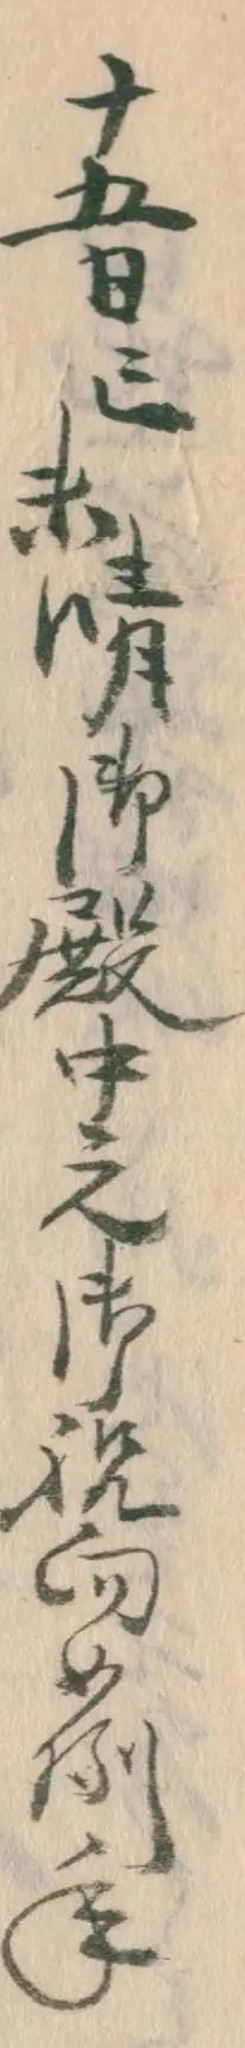十五日己未晴御殿中元御祝向如例年
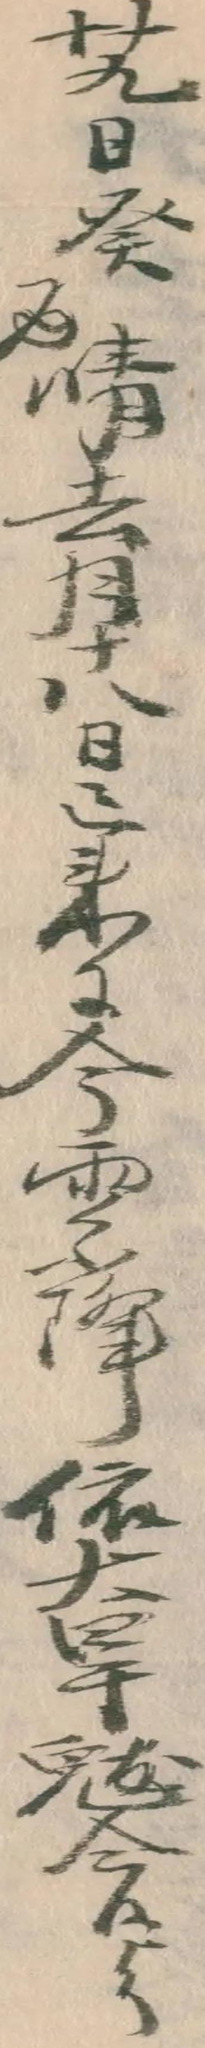廿九日癸酉晴去月十八日已来に今雨不降依大旱魃今日より
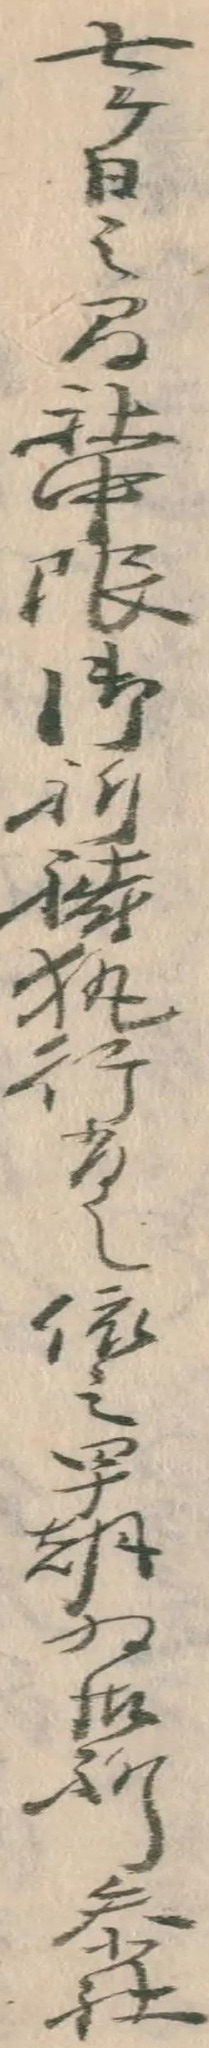七ヶ日之間社中限御祈祷執行有之依之早朝為御祈参社
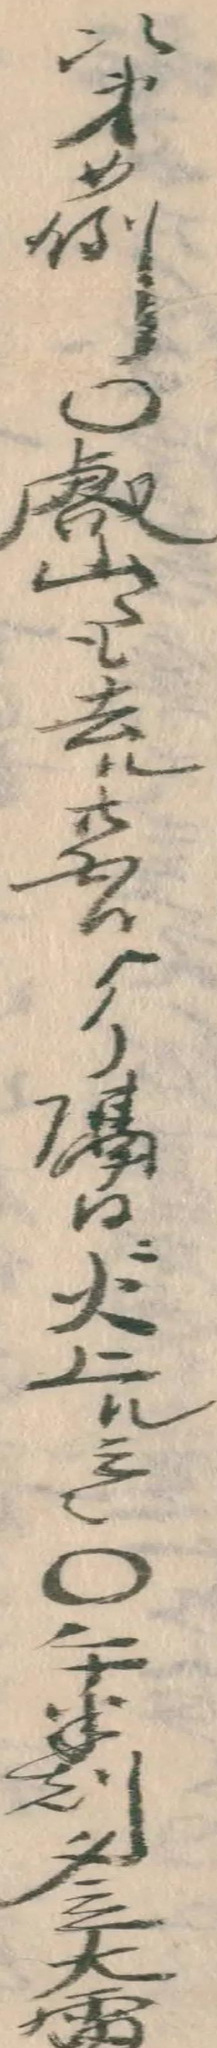次第如例○叡山らも去ル廿五日より隔日ニ火上ル云々○午半刻夕立大雷
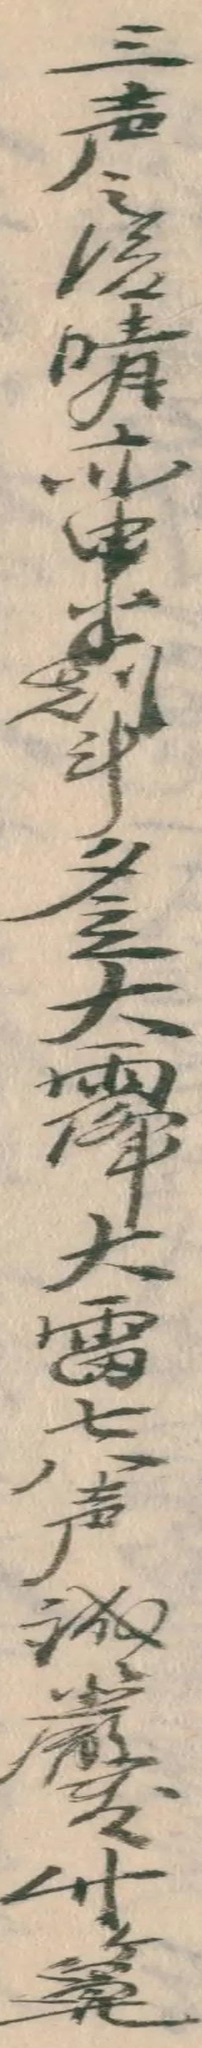三声之後晴亦申半刻斗夕立大雨降大雷七八声誠二巌敷竹ヶ鼻
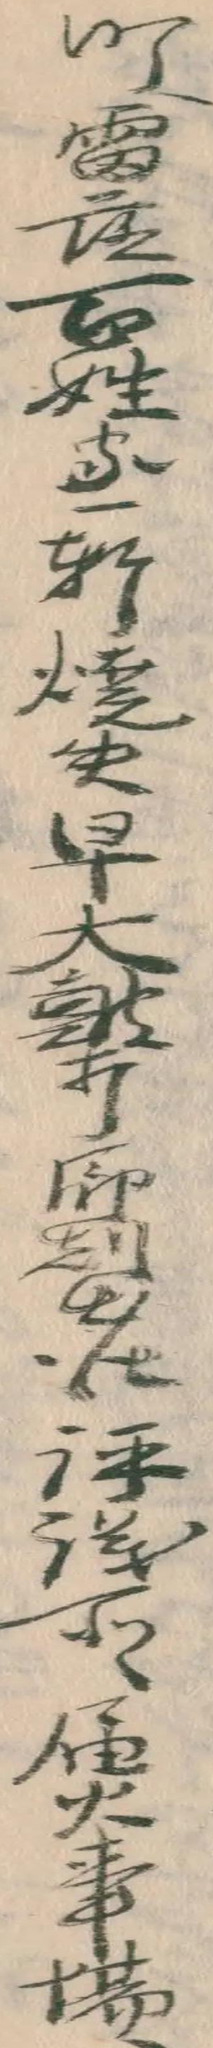町ヘ雷落百姓家一軒焼失早大皷打御割出仕評議所へ届火事場へ
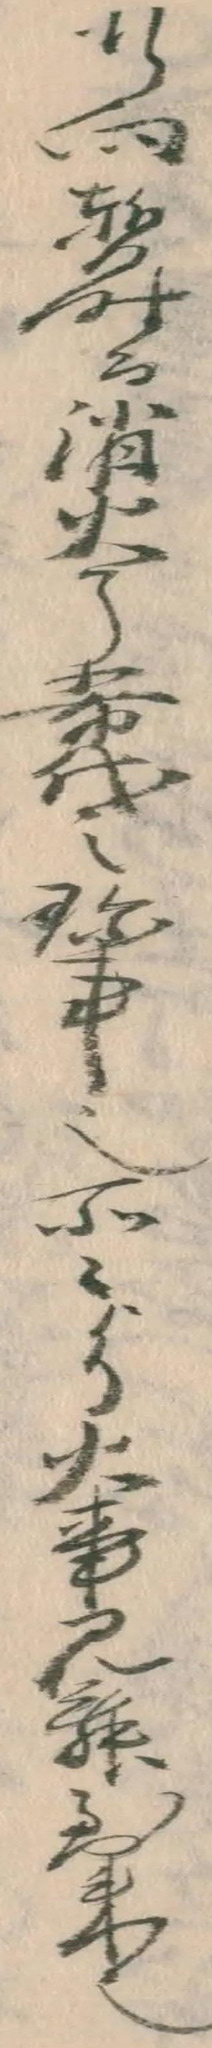行向暫時而消火了希代之珍事也所々より火事見舞到来也
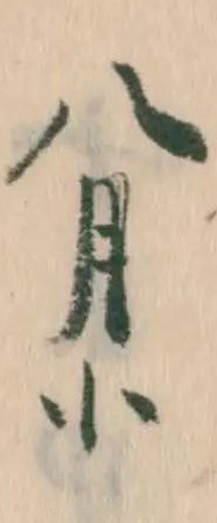八月小
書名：賀茂社記録. 第66冊
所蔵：国立国会図書館 National Diet Library, JAPAN
